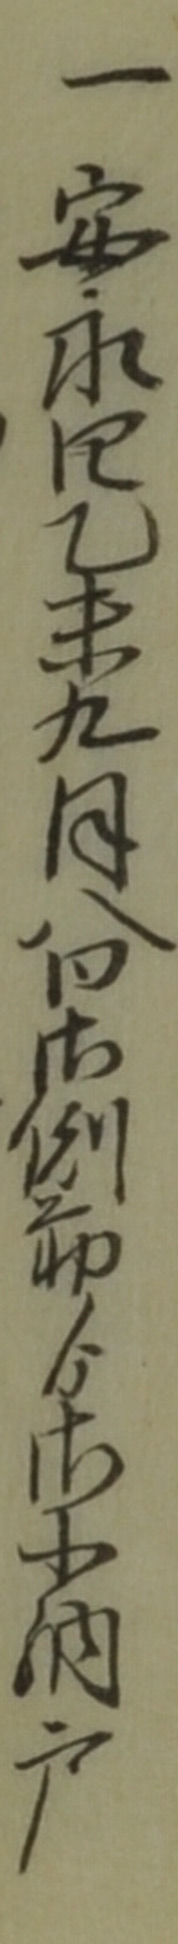一安永四乙巳九月八日御側勤ゟ御小納戸
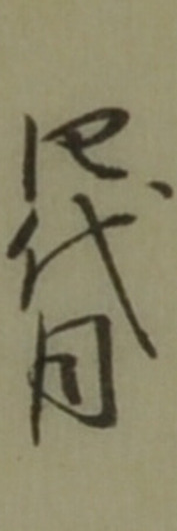四代目
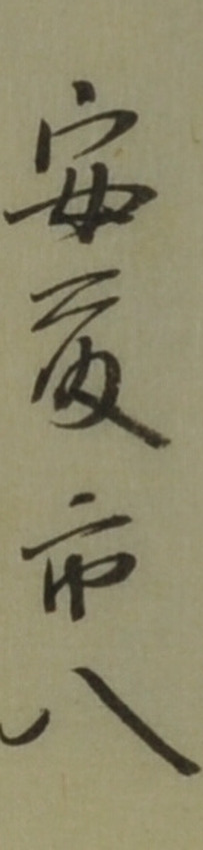安藤市八
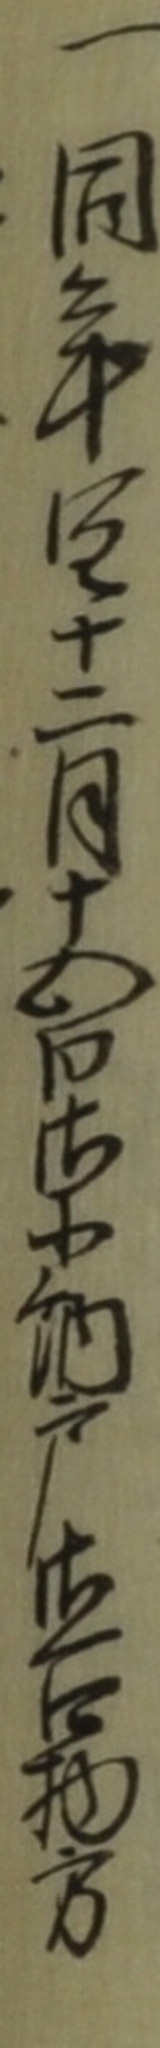一同年閏十二月十五日御小納戸御召物方
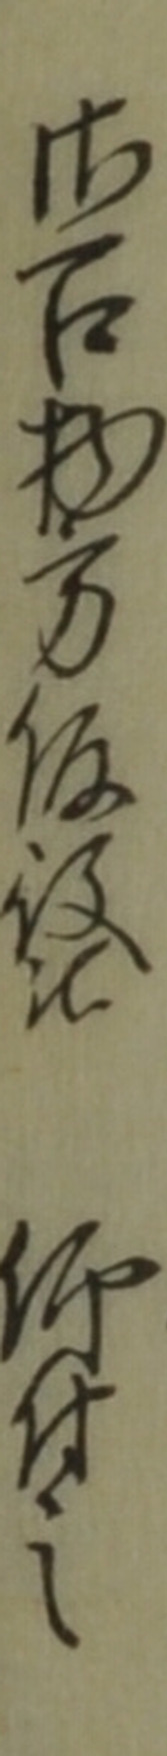御召物方仮役被仰付之
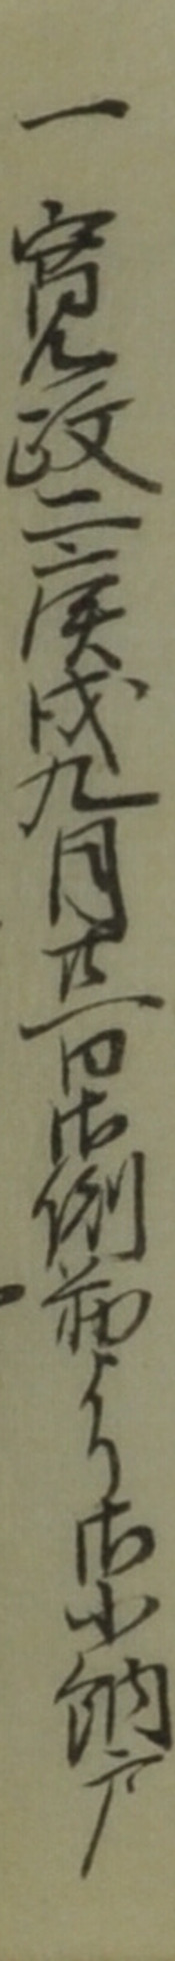一寛政二庚戌九月廿一日御側勤より御小納戸
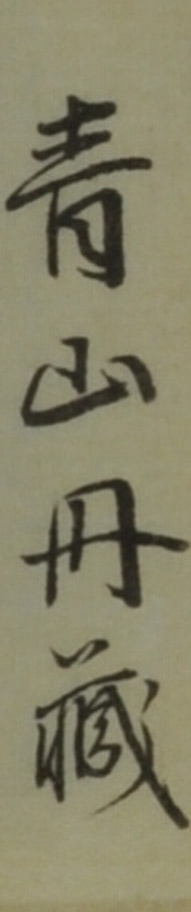青山丹蔵
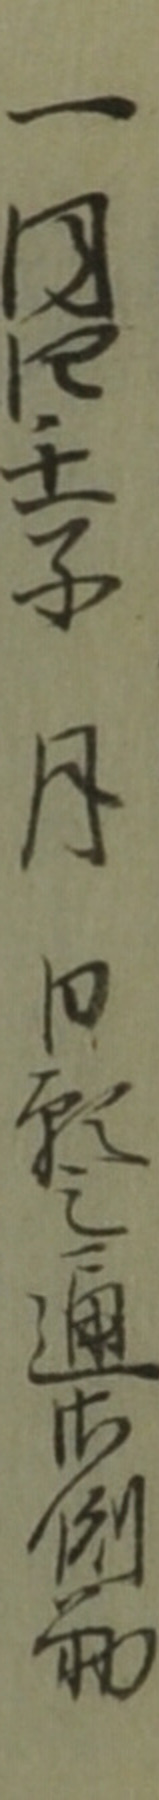一同四壬子月日願之通御側勤
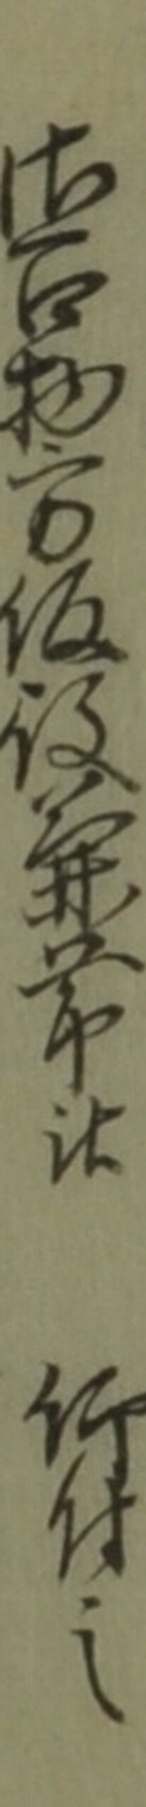御召物方仮役兼帯被仰付之
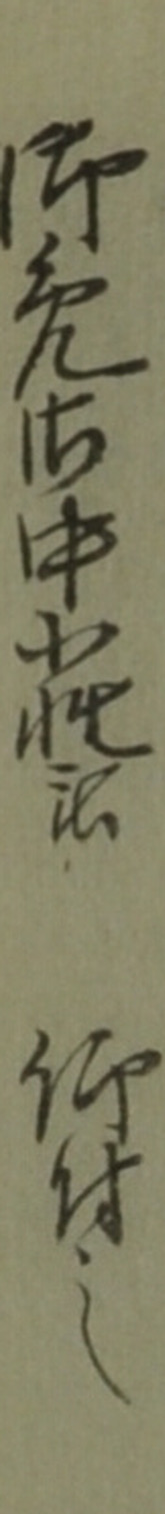御免御中小性被仰付之
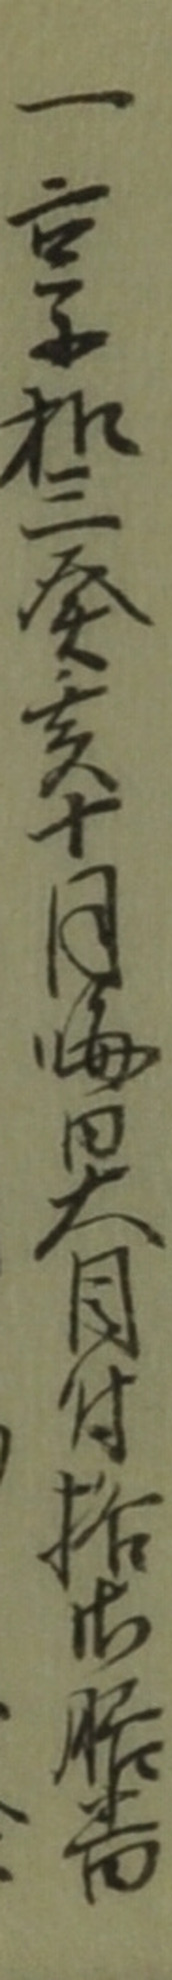一享和三癸亥十月晦日大目付格御膳番
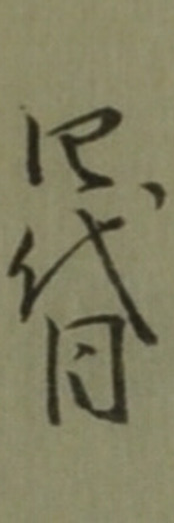四代目
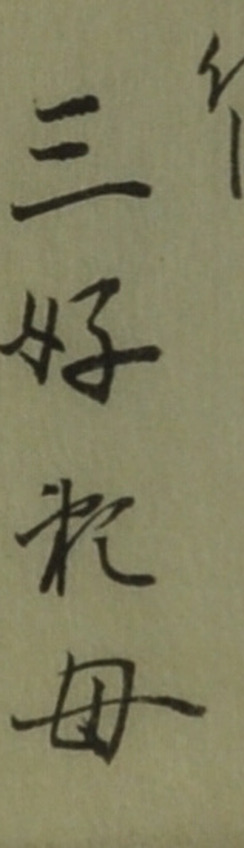三好頼母
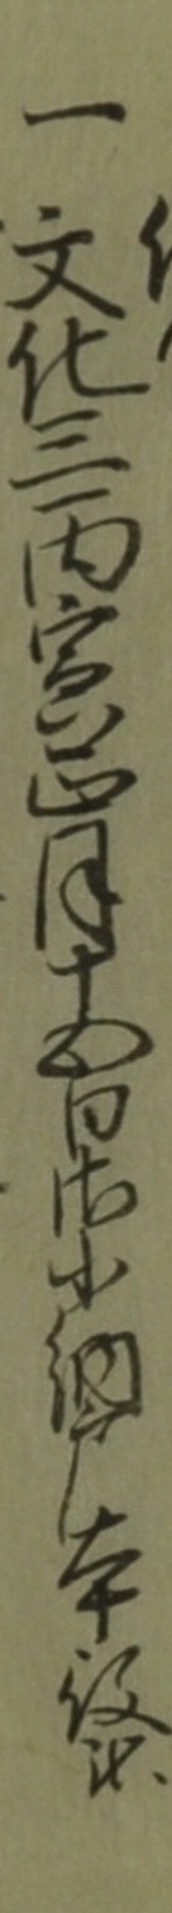一文化三丙寅正月十五日御小納戸本役被
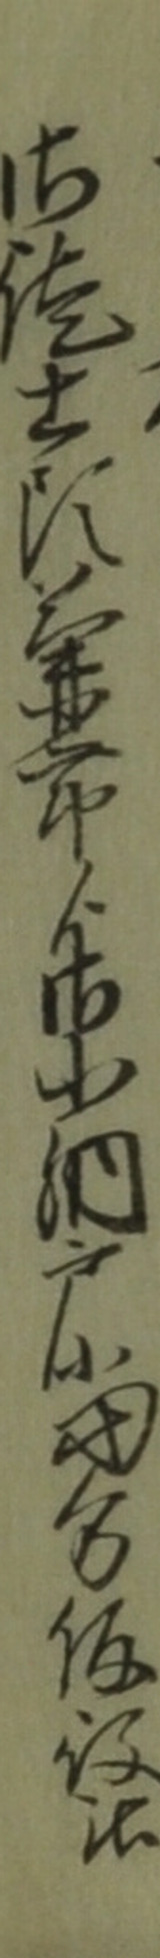御徒士頭兼帯ゟ御小納戸当分仮役被
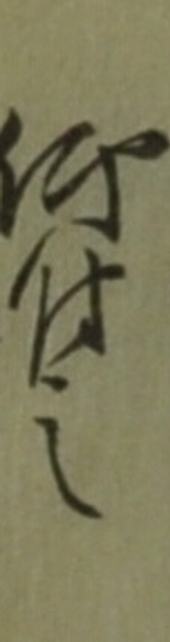仰付之
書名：諸御役代々録（四）
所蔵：伊那市立高遠町図書館・合同会社AMANE
